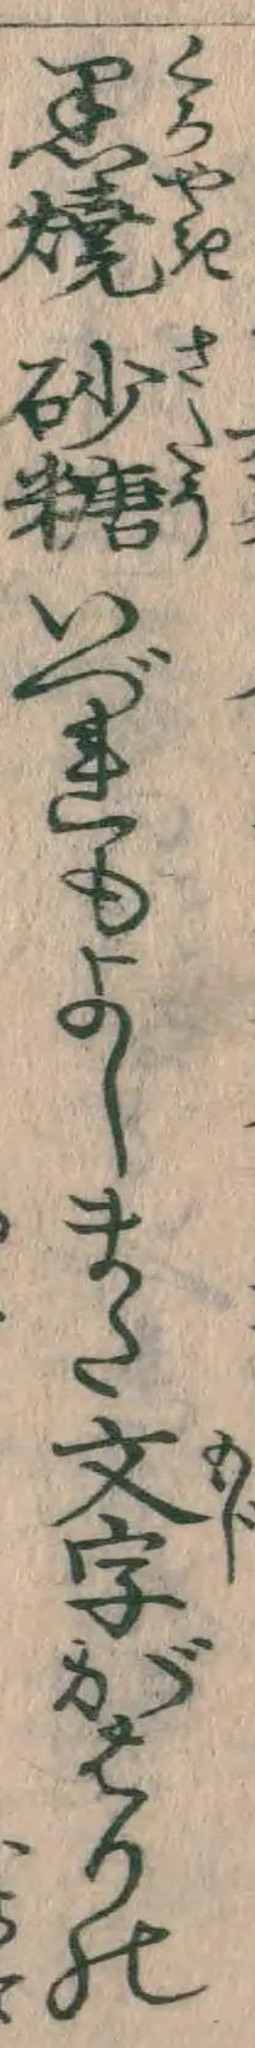黒焼砂糖いづれもよしまた文字がはりの
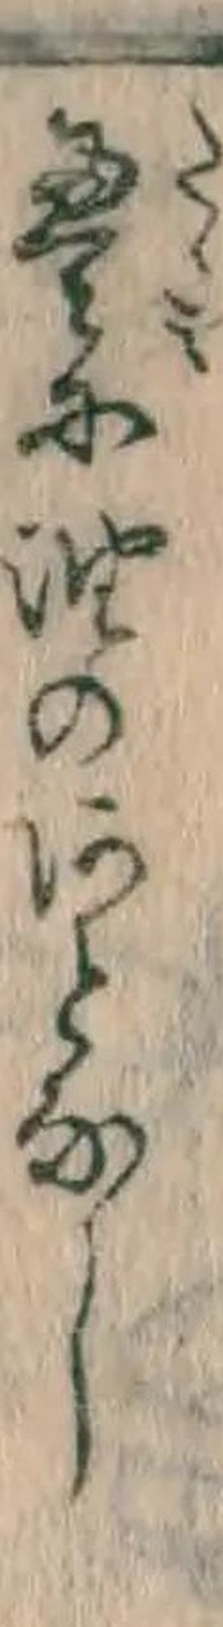畳に油のあとなし
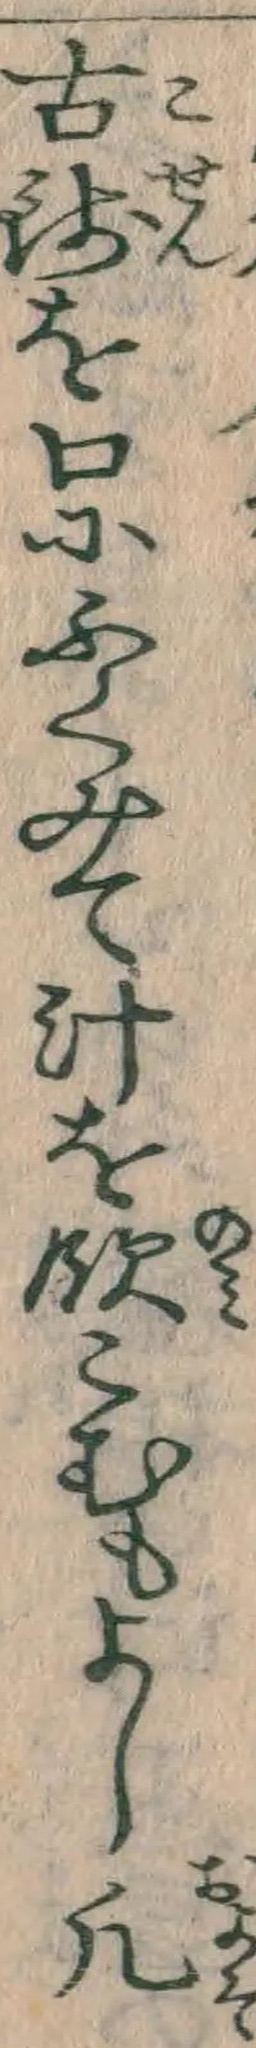古銭を口にふくみて汁を飲こむもよし凡
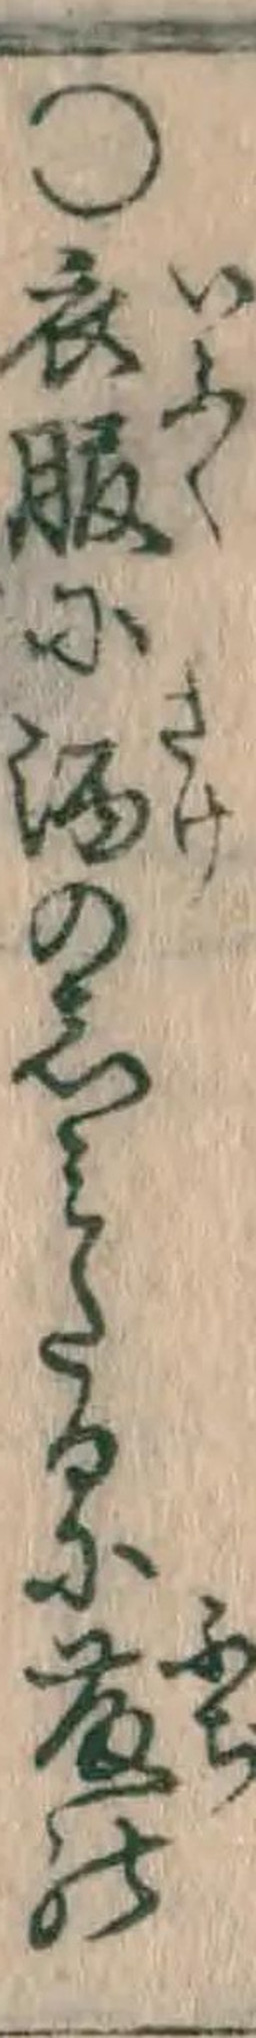○衣服に酒のしみたるに藤の
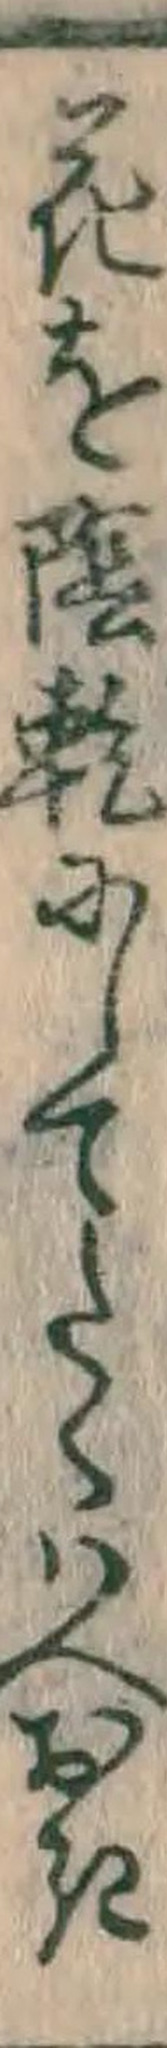花を陰乾にしてたくはへおき
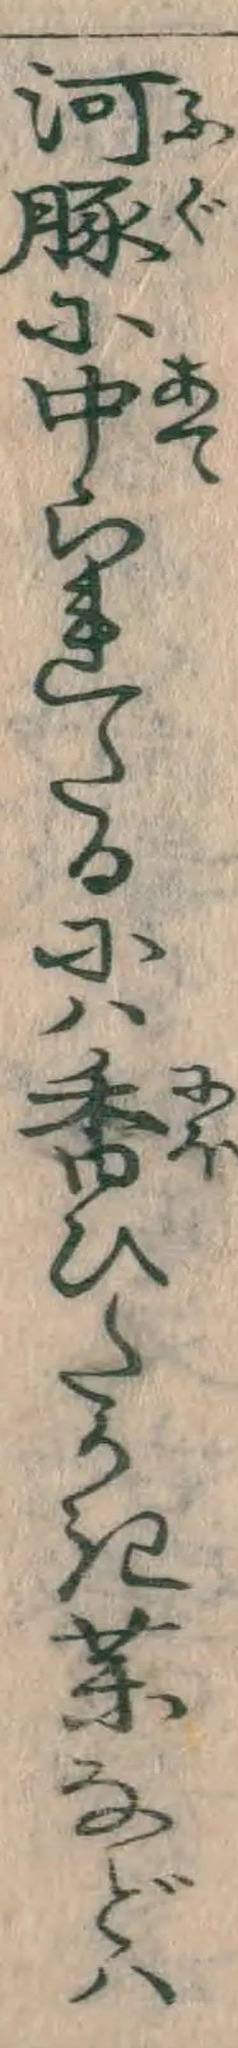河豚に中られたるには香ひたかき薬などは
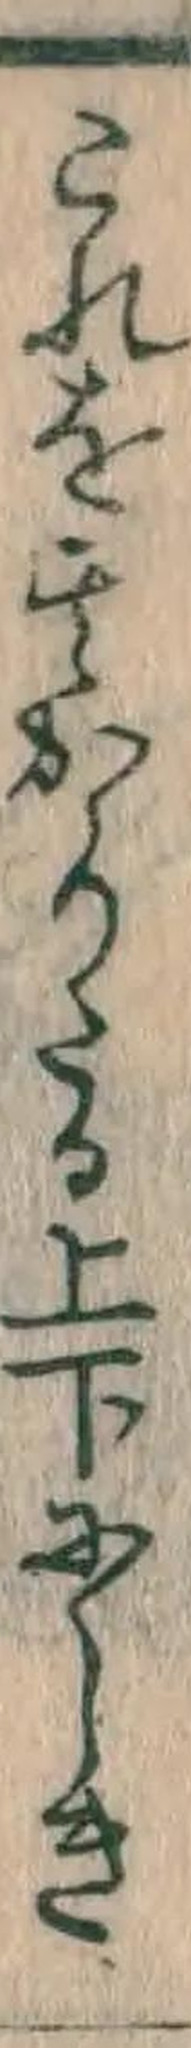これを其かゝりたる上下にしき
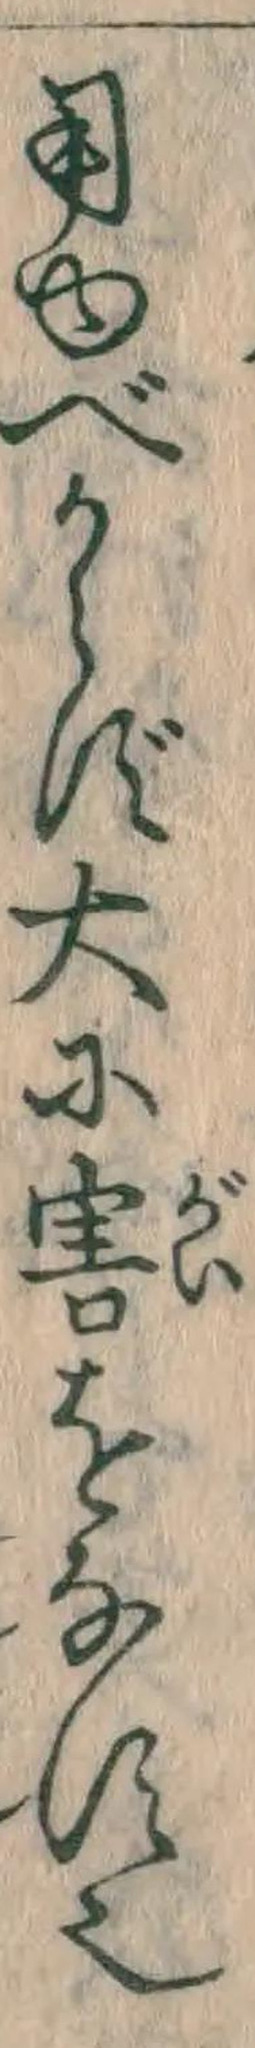用ゆべからず大に害をなす也
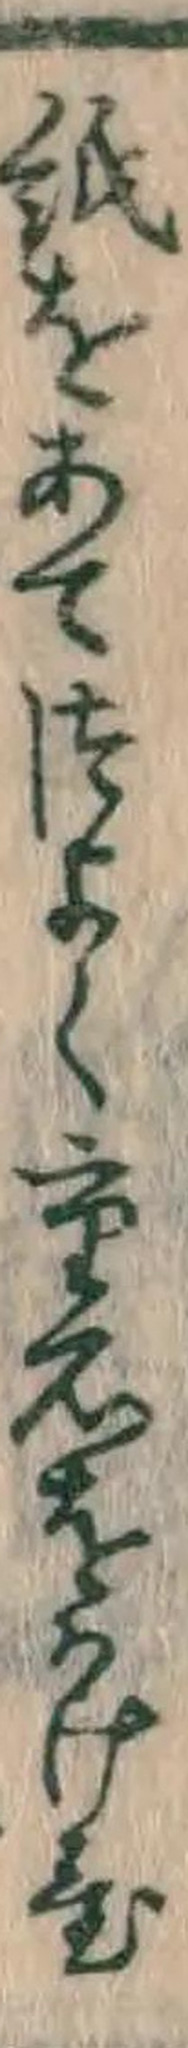紙をあてつよく重石をかけ置
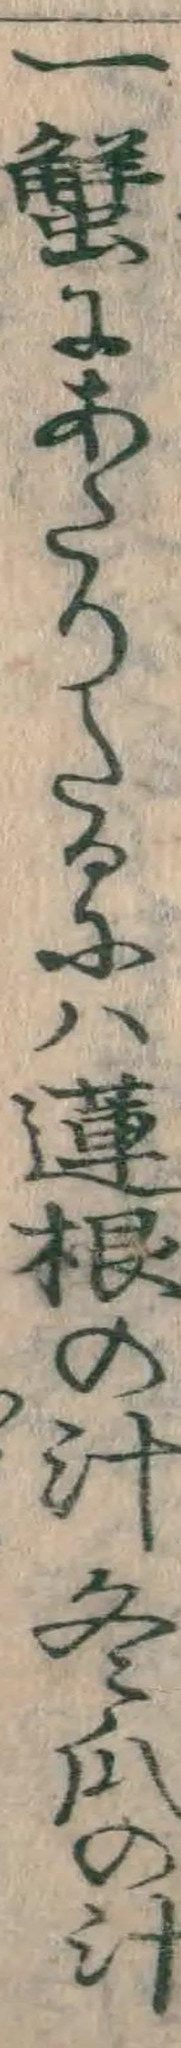一蟹にあたりたるには蓮根の汁冬瓜の汁
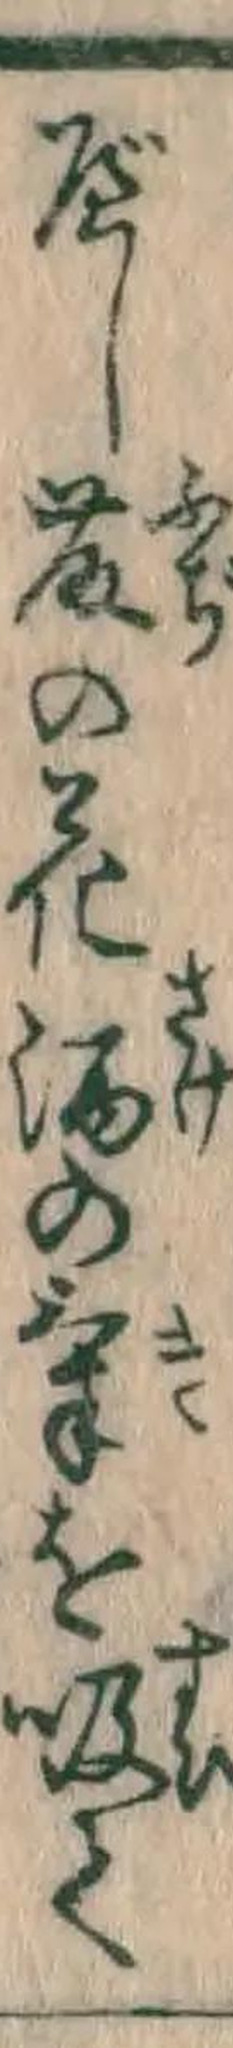べし藤の花酒の気を吸て
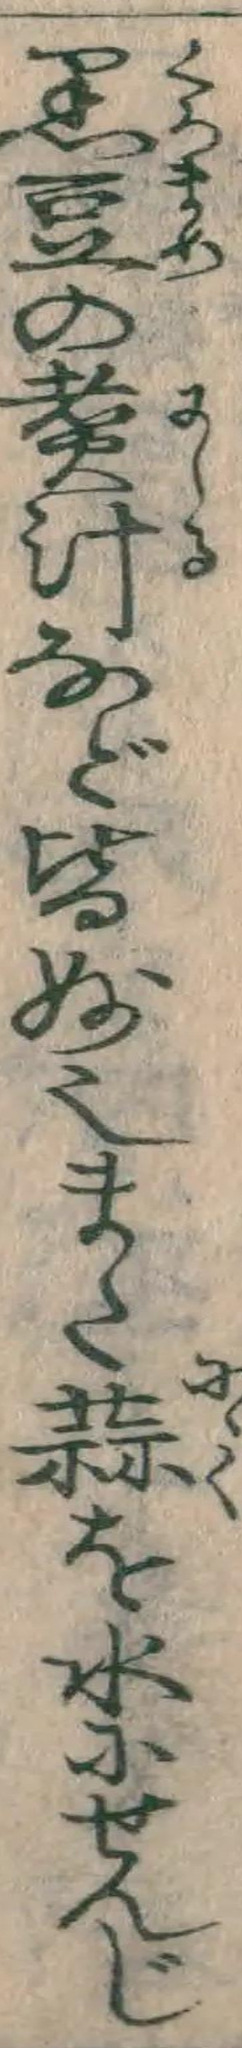黒豆の煮汁など皆妙也また蒜を水にせんじ
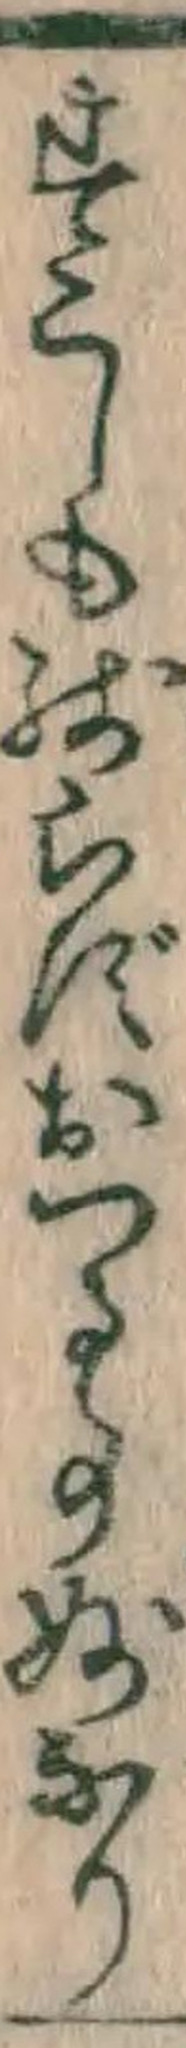すこしも残らずおつる事妙なり
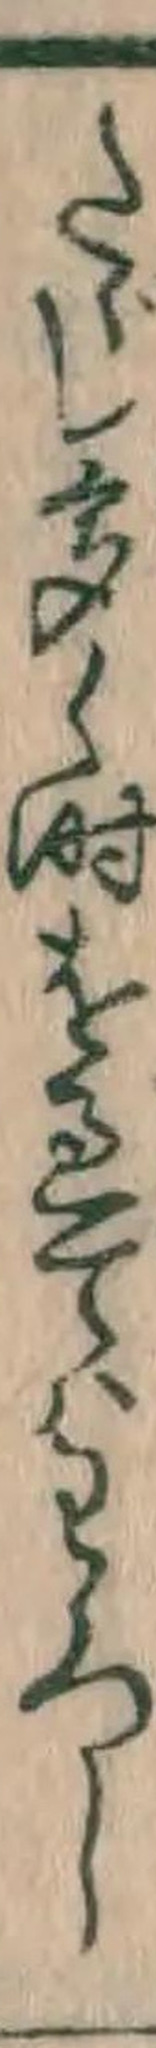たゞし多く時を過てはわろし
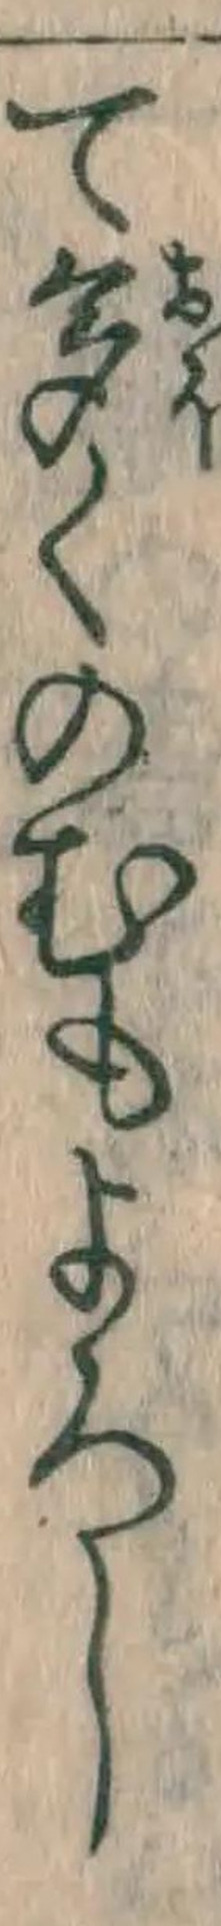て多くのむもよろし

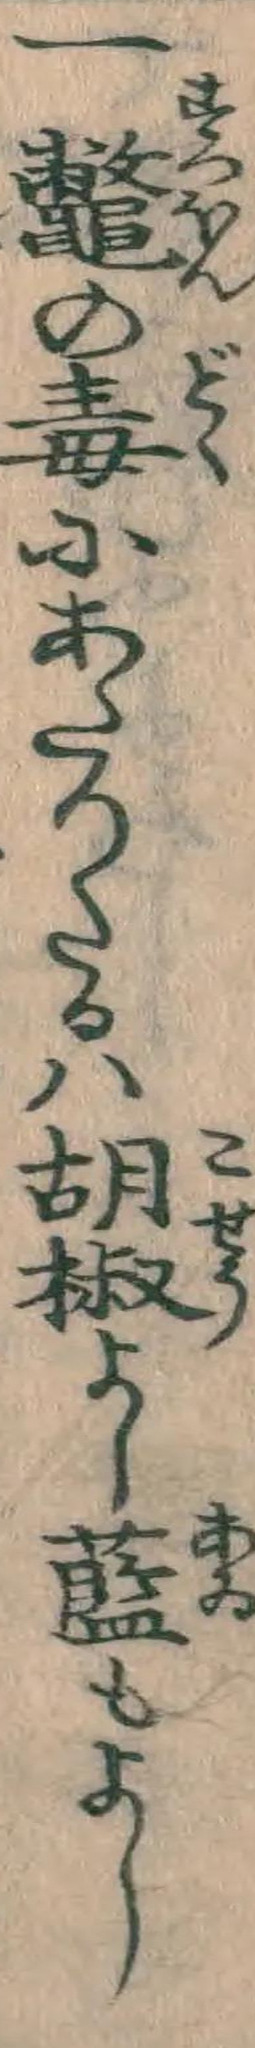一鼈の毒にあたりたるは胡椒よし藍もよし
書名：広益秘事大全 3巻. [3]
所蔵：国立国会図書館 National Diet Library, JAPAN
